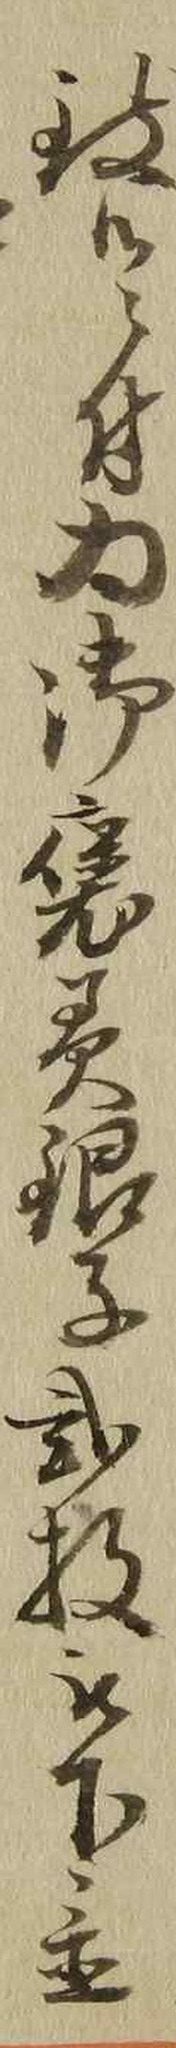致候ニ付為御褒美銀子弐枚被下置
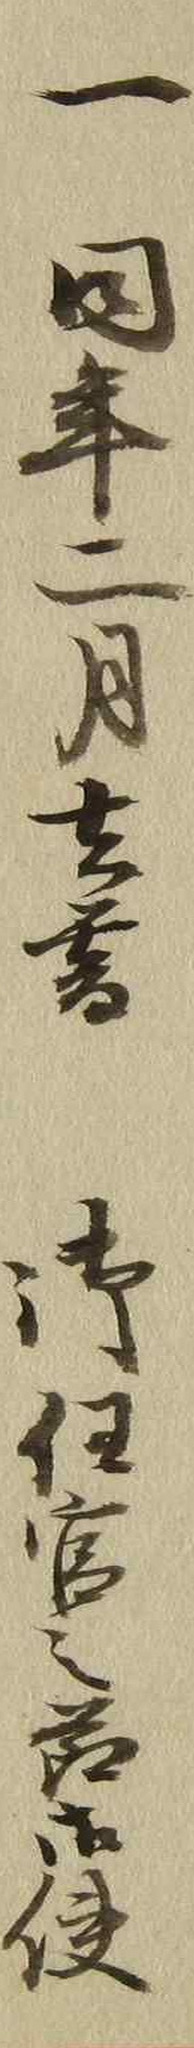一同年二月去暮御任官之節御使
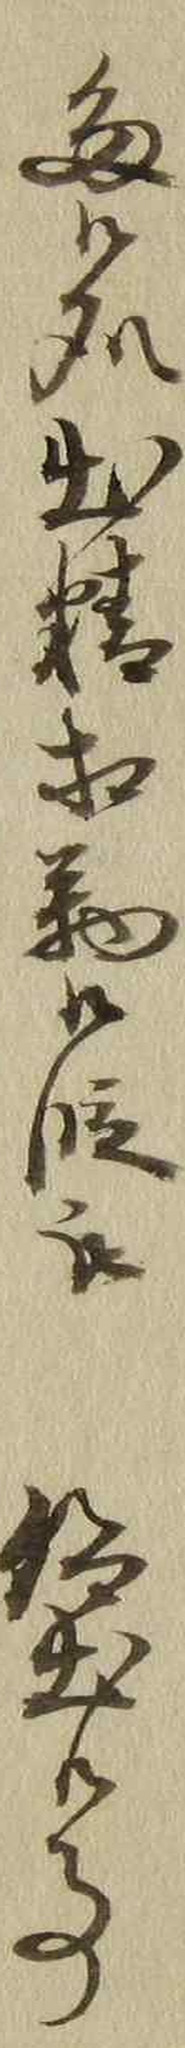多候処出精相勤候段被仰出候事
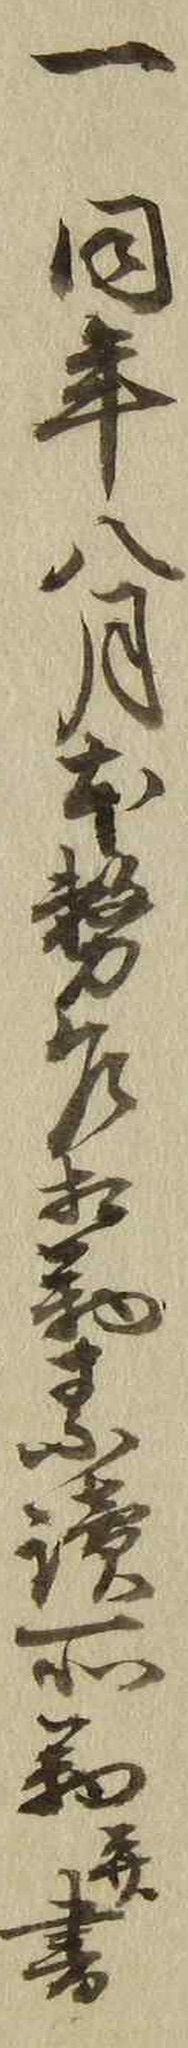一同年八月本務乍相勤素読所勤并書
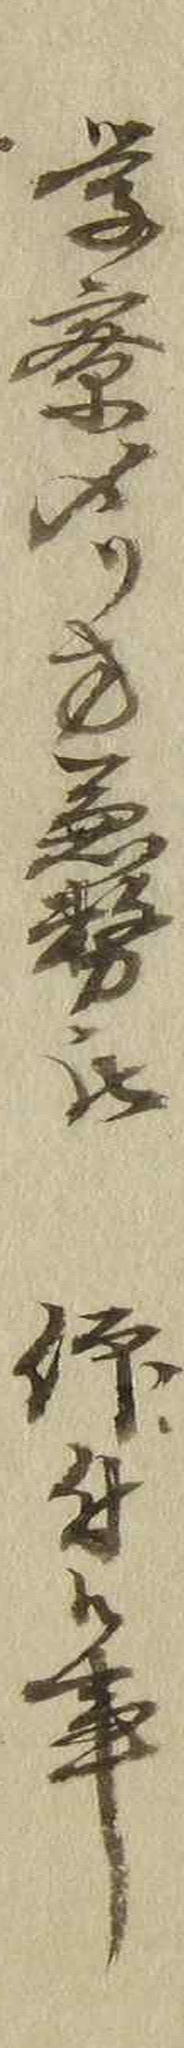学寮〆り方兼務被仰付候事

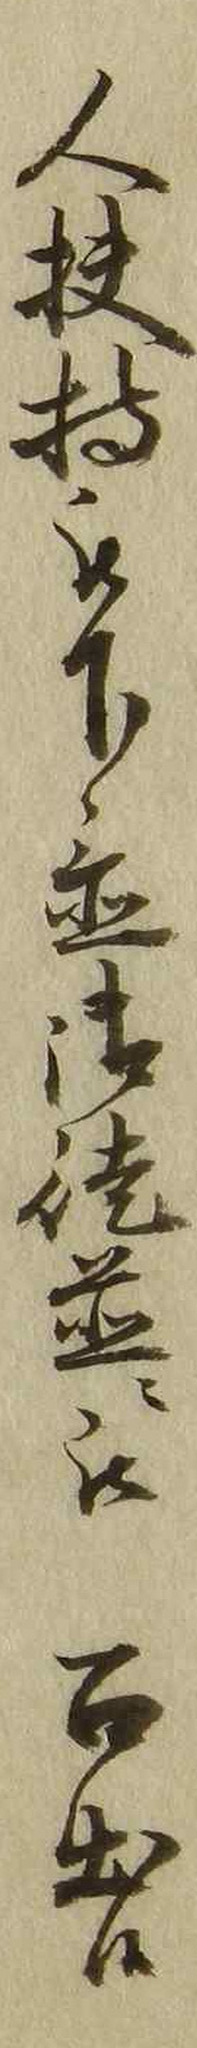人扶持被下置御徒並ニ被召出候
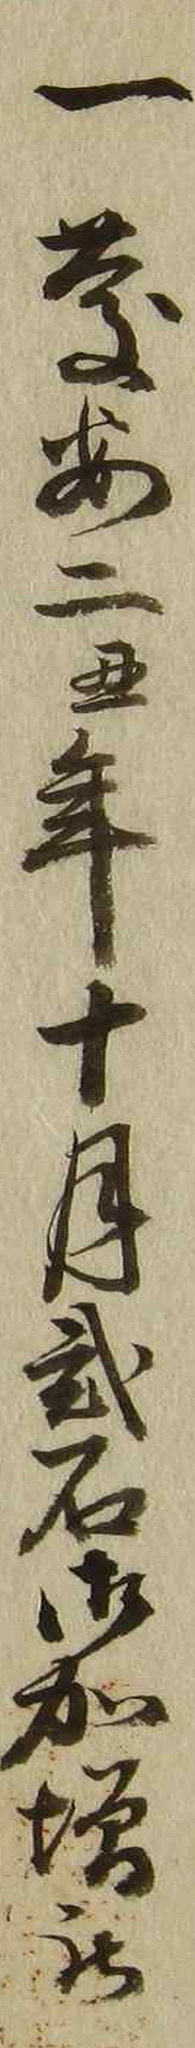一慶安二丑年十月弐石御加増被
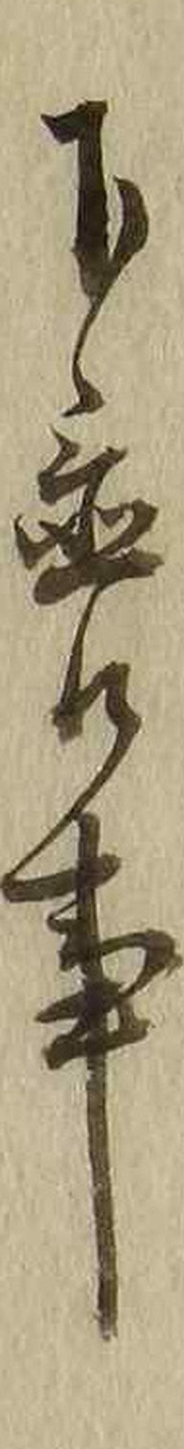下置候事
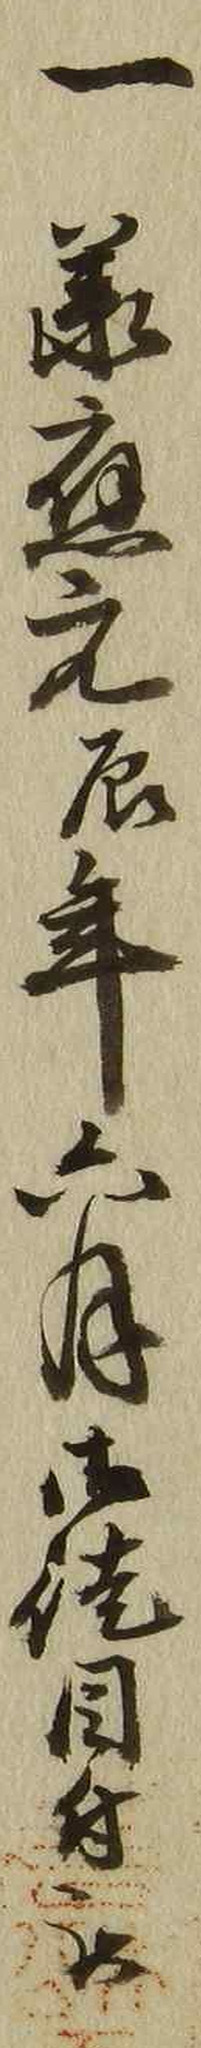一承応元辰年六月御徒目付被
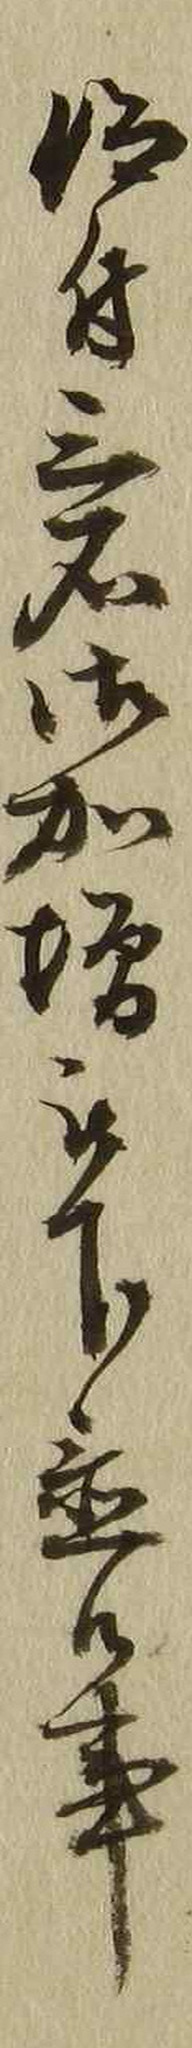仰付三石御加増被下置候事
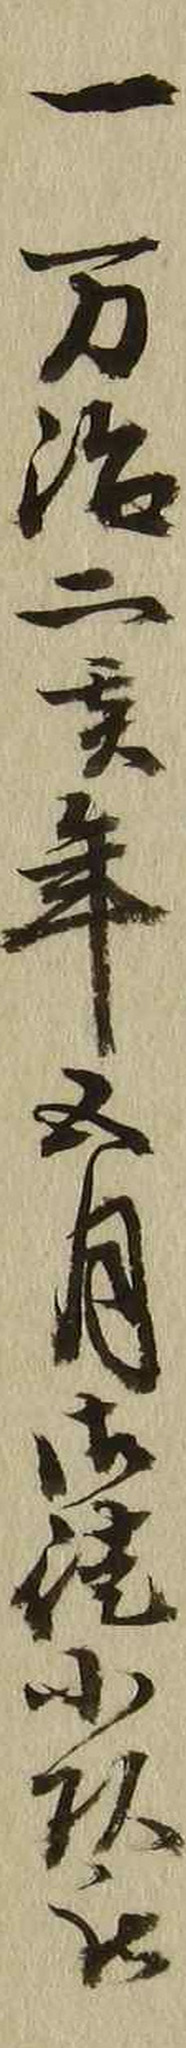一万治二亥年五月御徒小頭被
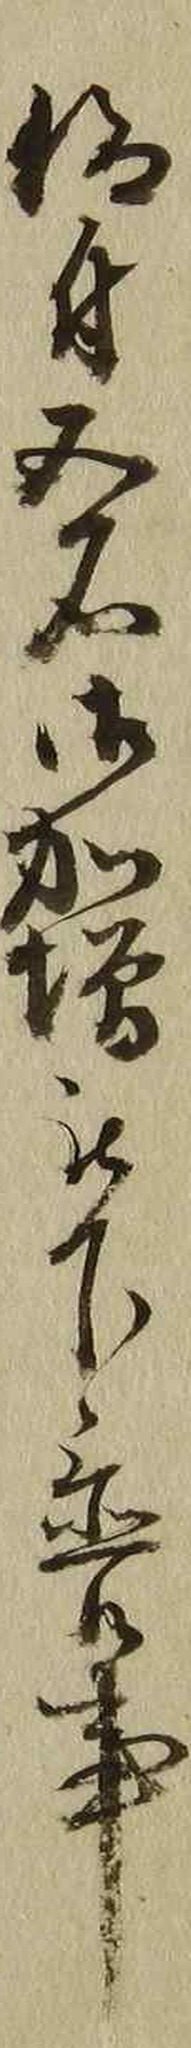仰付五石御加増被下置候事
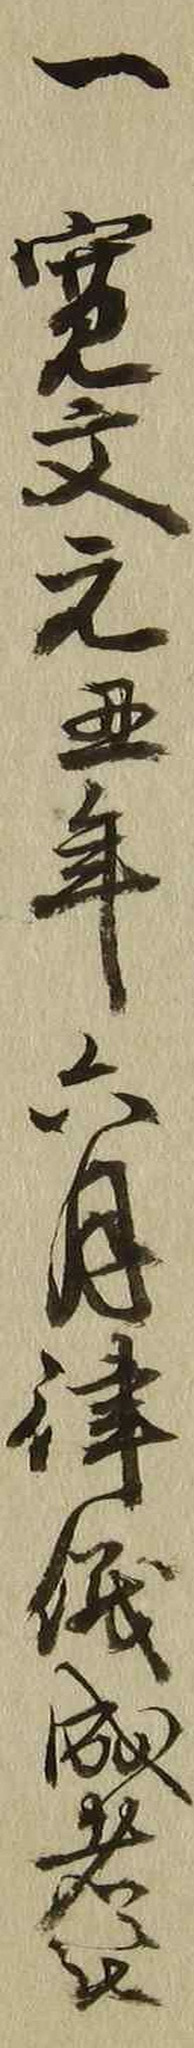一寛文元丑年六月律義成者ニ被
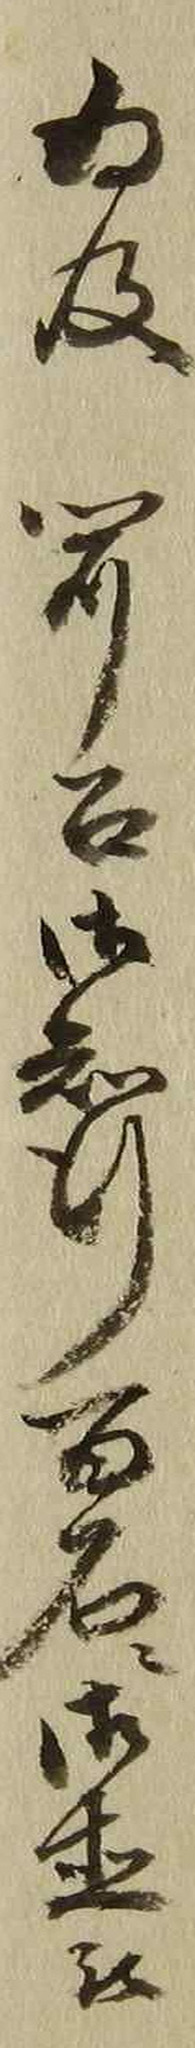為及聞召御知行百石ニ御直被
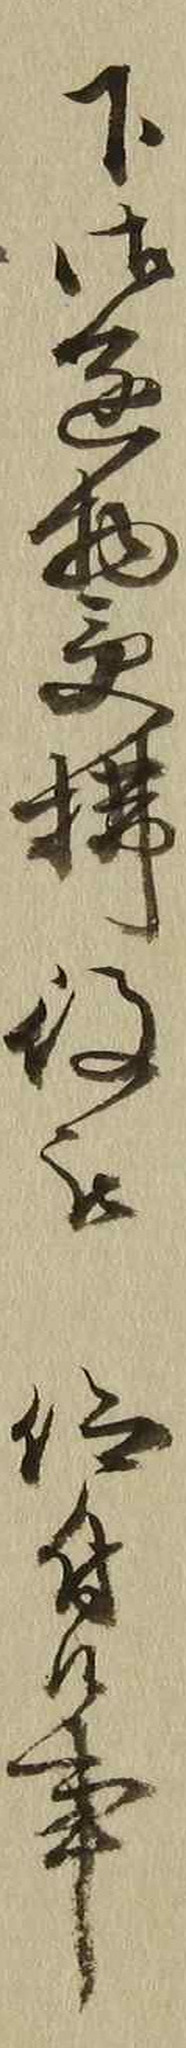下御進物受払役被仰付候事
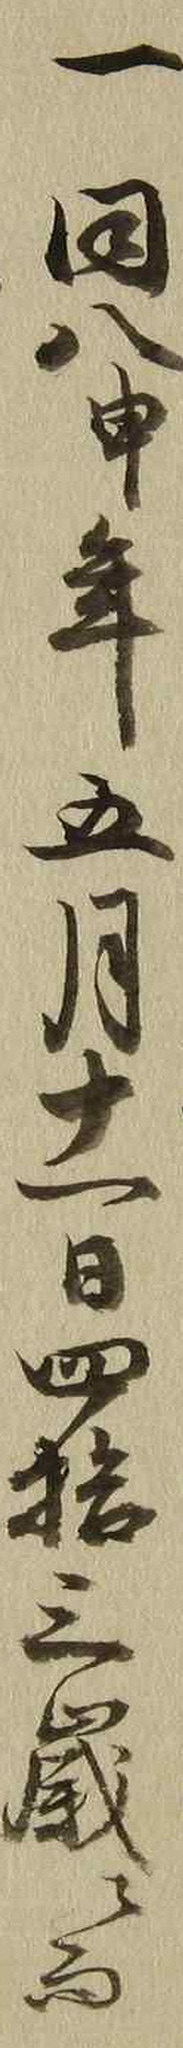一同八申年五月十一日四拾三歳ニ而
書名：諸士系譜　巻之64　と之部7
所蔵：会津若松市立会津図書館
